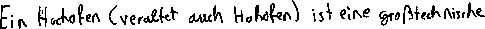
Ein Hochofen (veraltet auch Hohofen) ist eine großtechnische
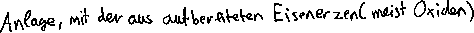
Anlage, mit der aus aufbereiteten Eisenerzen (meist Oxiden)
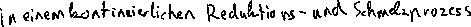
in einem kontinuierlichen Reduktions- und Schmelzprozess
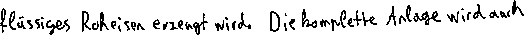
flüssiges Roheisen erzeugt wird. Die komplette Anlage wird auch
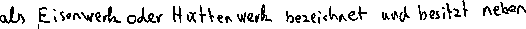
als Eisenwerk oder Hüttenwerk bezeichnet und besitzt neben
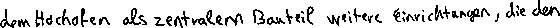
dem Hochofen als zentralem Bauteil weitere Einrichtungen, die den
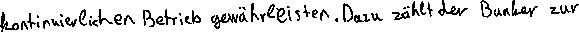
kontinuierlichen Betrieb gewährleisten. Dazu zählt der Bunker zur
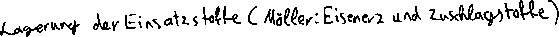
Lagerung der Einsatzstoffe (Möller: Eisenerz und Zuschlagstoffe)
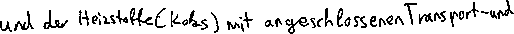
und der Heizstoffe (Koks) mit angeschlossenen Transport- und
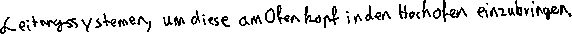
Leitungssystemen, um diese am Ofenkopf in den Hochofen einzubringen.
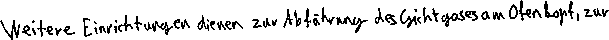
Weitere Einrichtungen dienen zur Abführung des Gichtgases am Ofenkopf, zur
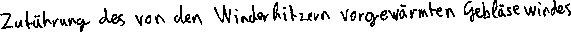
Zuführung des von den Winderhitzern vorgewärmten Gebläsewindes
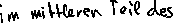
im mittleren Teil des
